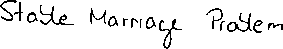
Stable Marriage Problem
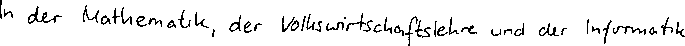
In der Mathematik, der Volkswirtschaftslehre und der Informatik
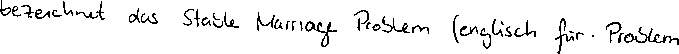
bezeichnet das Stable Marriage Problem (englisch für: Problem
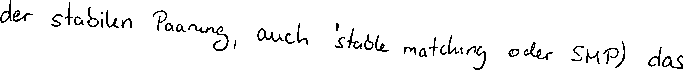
der stabilen Paarung, auch "stable matching oder SMP) das
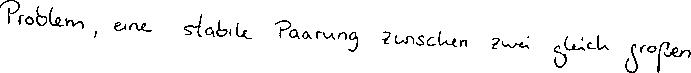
Problem, eine stabile Paarung zwischen zwei gleich großen
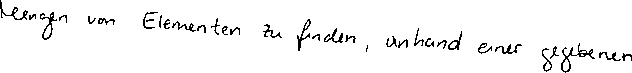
Mengen von Elementen zu finden, anhand einer gegebenen
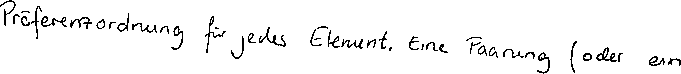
Präferenzordnung für jedes Element. Eine Paarung (oder ein
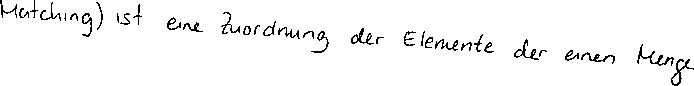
Matching) ist eine Zuordnung der Elemente der einen Menge
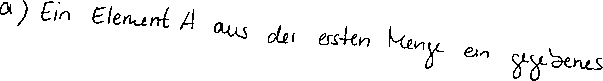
a.) Ein Element A aus der ersten Menge ein gegebenes
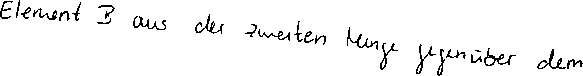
Element B aus der zweiten Menge gegenüber dem
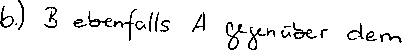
b.) B ebenfalls A gegenüber dem
